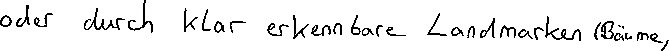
oder durch klar erkennbare Landmarken (Bäume,
